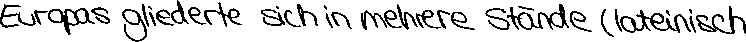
Europas gliederte sich in mehrere Stände (lateinisch
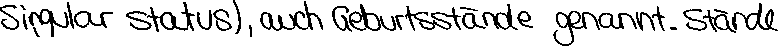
Singular status), auch Geburtsstände genannt. Stände
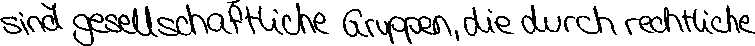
sind gesellschaftliche Gruppen, die durch rechtliche
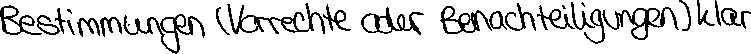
Bestimmungen (Vorrechte oder Benachteiligungen) klar
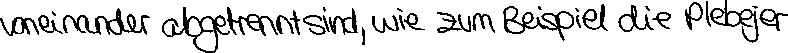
voneinander abgetrennt sind, wie zum Beispiel die Plebejer
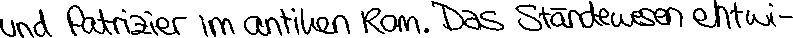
und Patrizier im antiken Rom. Das Ständewesen entwi-
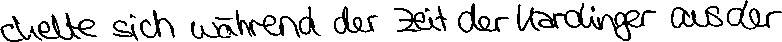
ckelte sich während der Zeit der Karolinger aus der
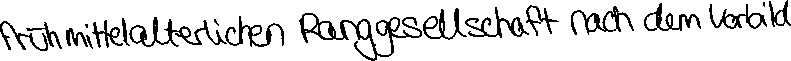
frühmittelalterlichen Ranggesellschaft nach dem Vorbild
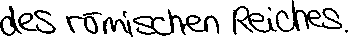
des Römischen Reiches.
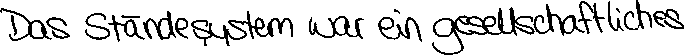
Das Ständesystem war ein gesellschaftliches
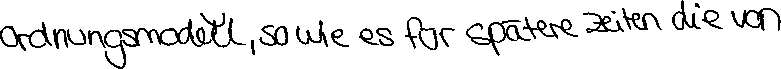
Ordnungsmodell, so wie es für spätere Zeiten die von
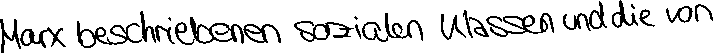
Marx beschriebenen sozialen Klassen und die von
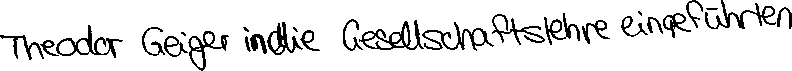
Theodor Geiger in die Gesellschaftslehre eingeführten
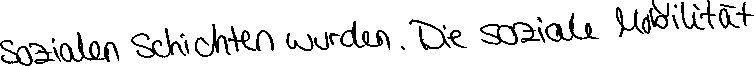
sozialen Schichten wurden. Die soziale Mobilität
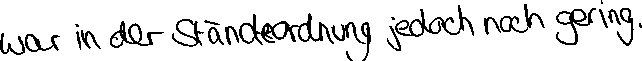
war in der Ständeordnung jedoch noch gering.
